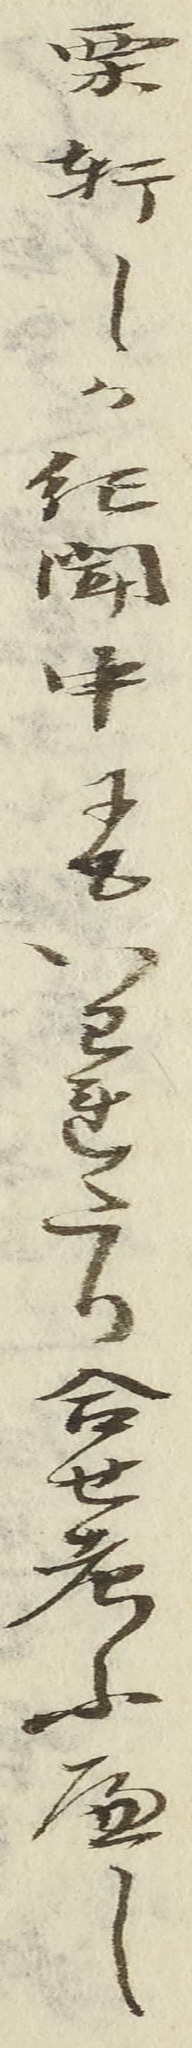栗軒しか紀聞中にもいわれたり合せ考ふへし
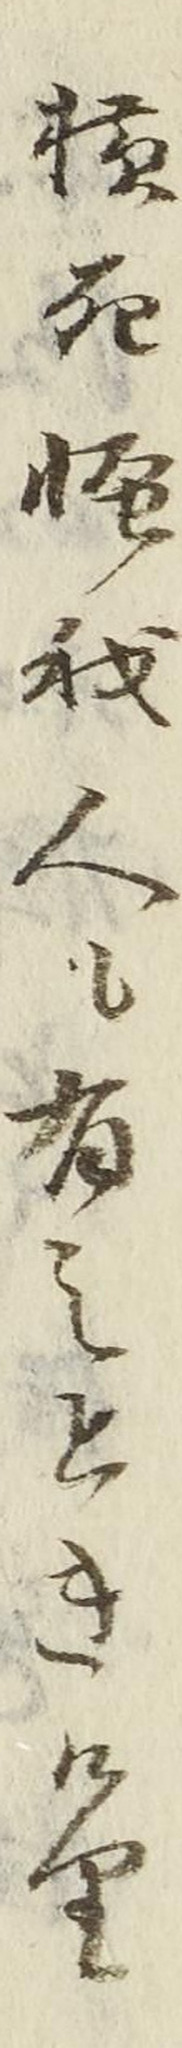横死怪我人も有之ときけり
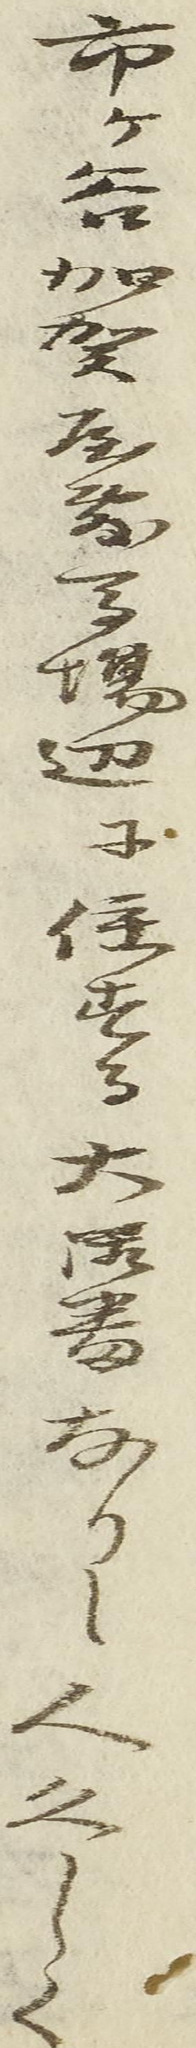市ヶ谷加賀屋敷馬場辺に住せる大御番なりし人久しく
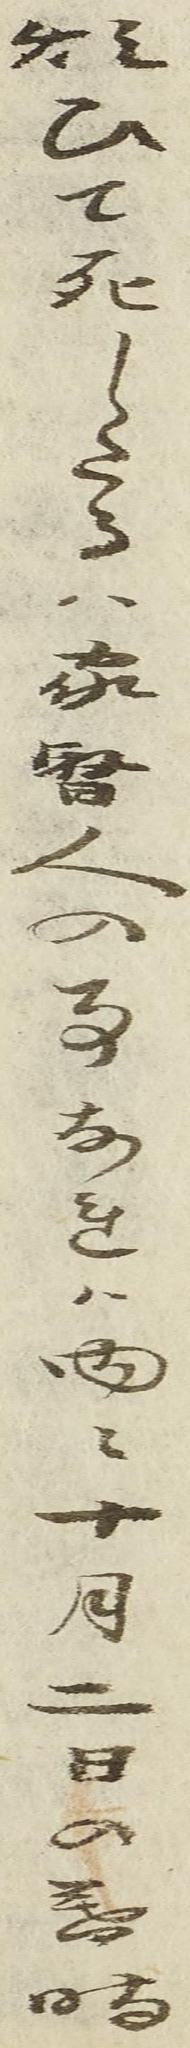煩ひて死したるハ家督に人の事なれハ内々二十月二日の暮時

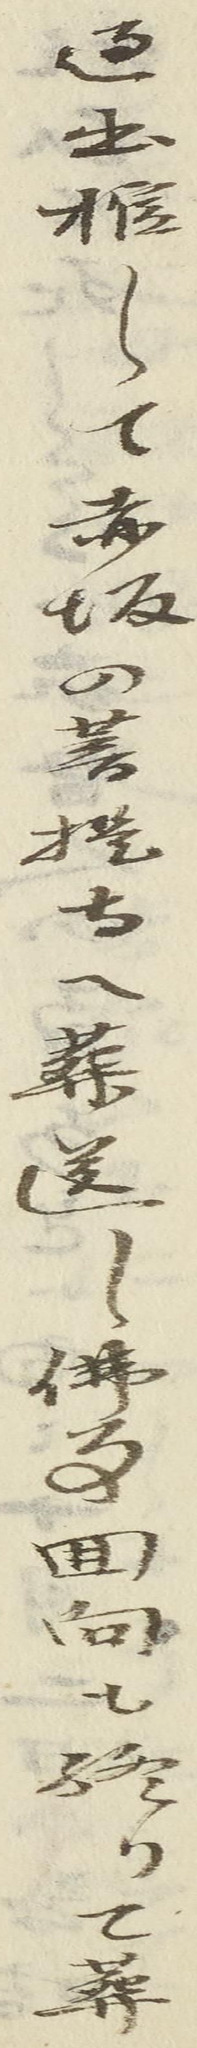過出棺して赤坂の菩提寺へ葬送し仏事回向も終りて葬
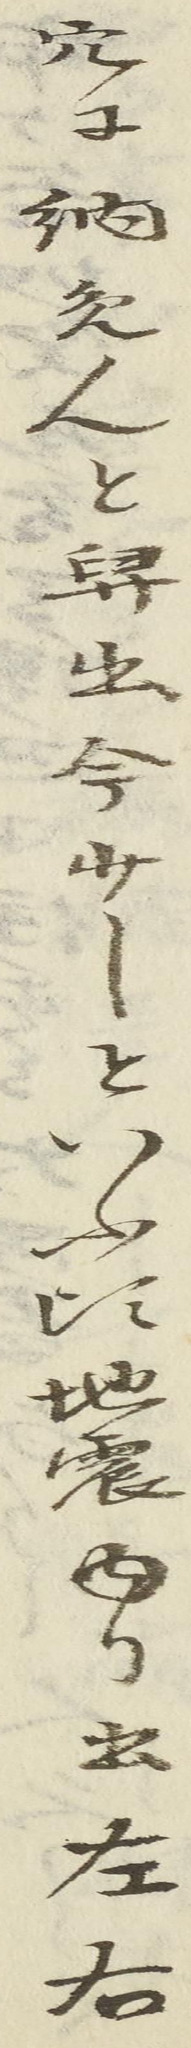穴に納めんと舁出今少しといふ頃地震ゆり出左右
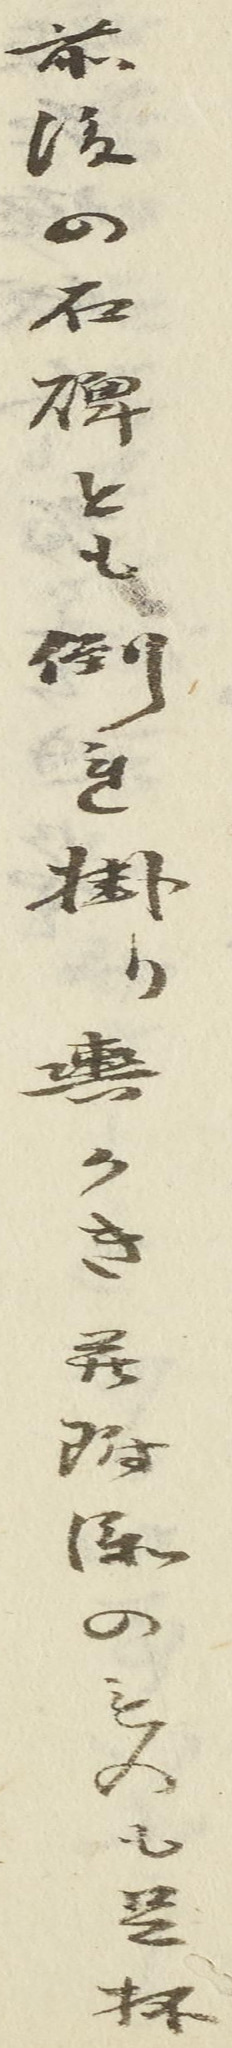前後の石碑とも倒れ掛り輿ヶき并附添のものも足抔
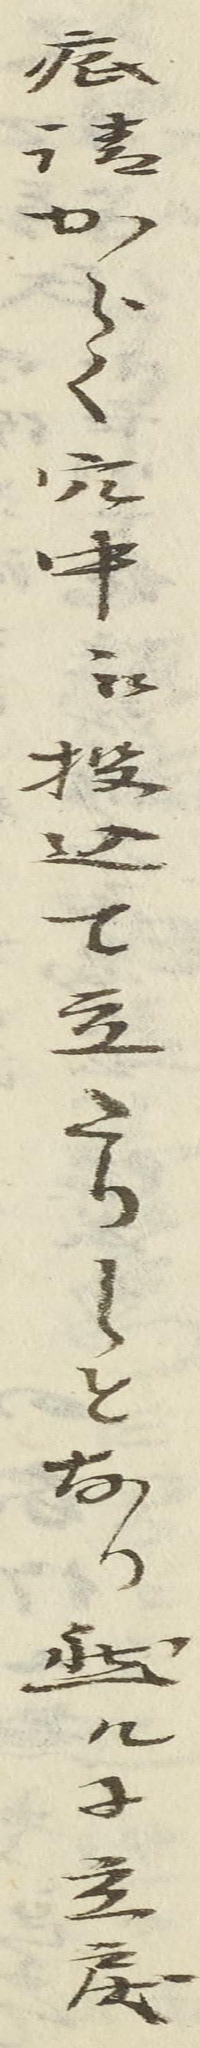疵請からく穴中江投込て立たりしとなり然ㇽに立戻
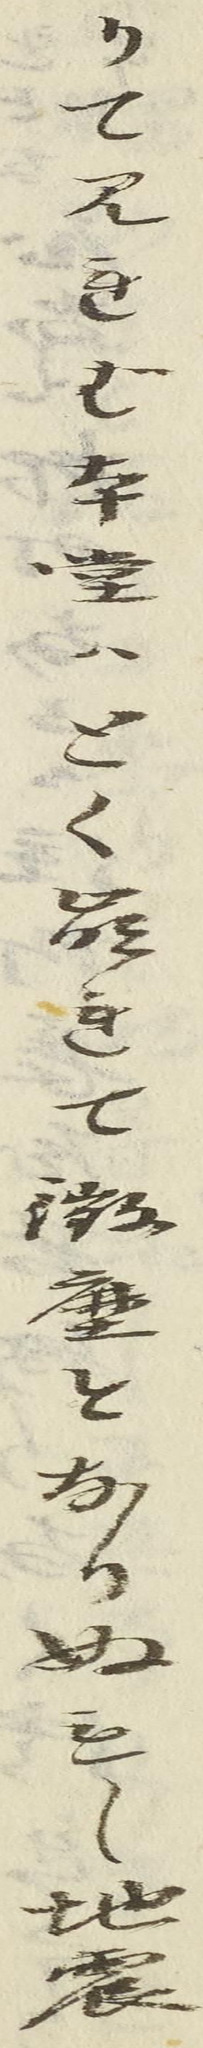りて見れば本堂ハとく崩れて微塵となりぬもし地震
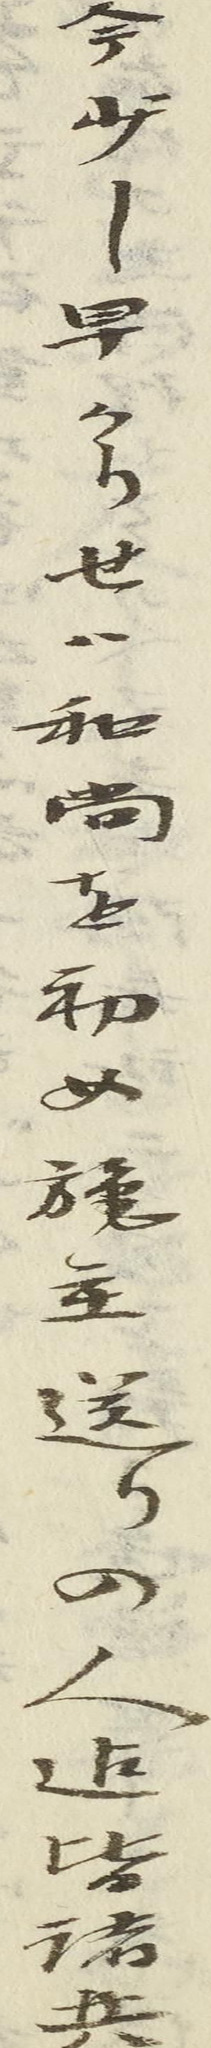今少し早ヶりせハ和尚を初め施主送りの人迄皆諸共
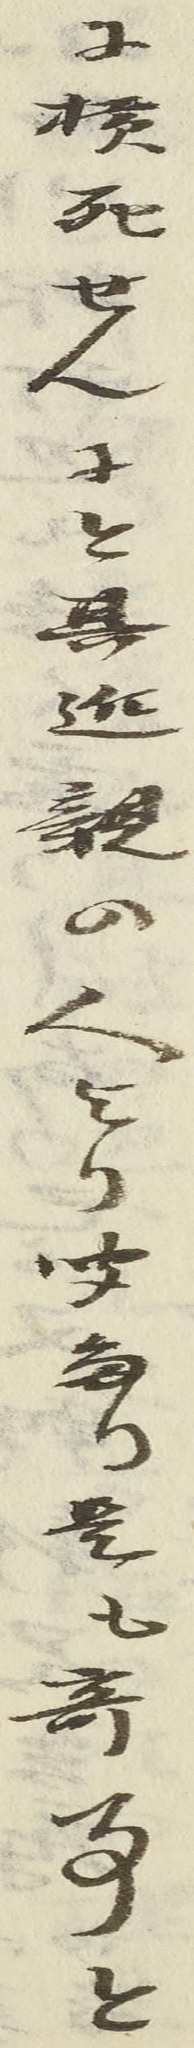に横死せんにと其近親の人より聞たりも奇事と
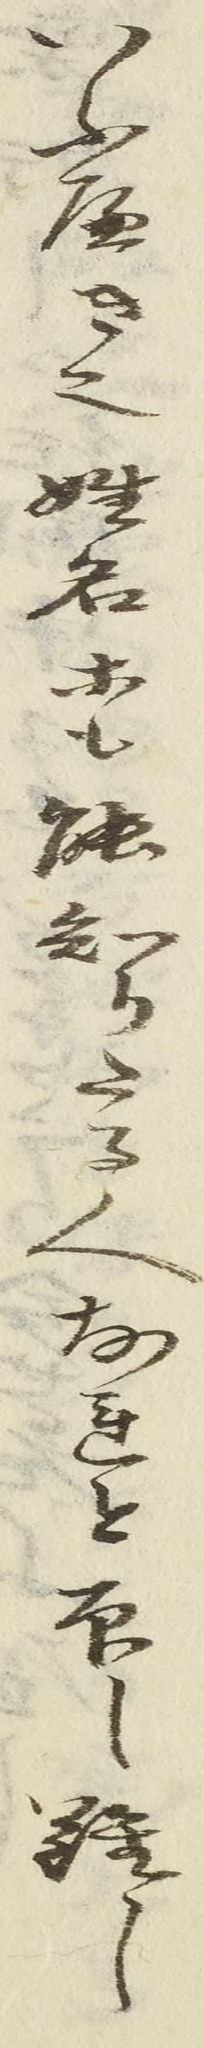いふへき也姓名等も能知りたる人なれと印し難し
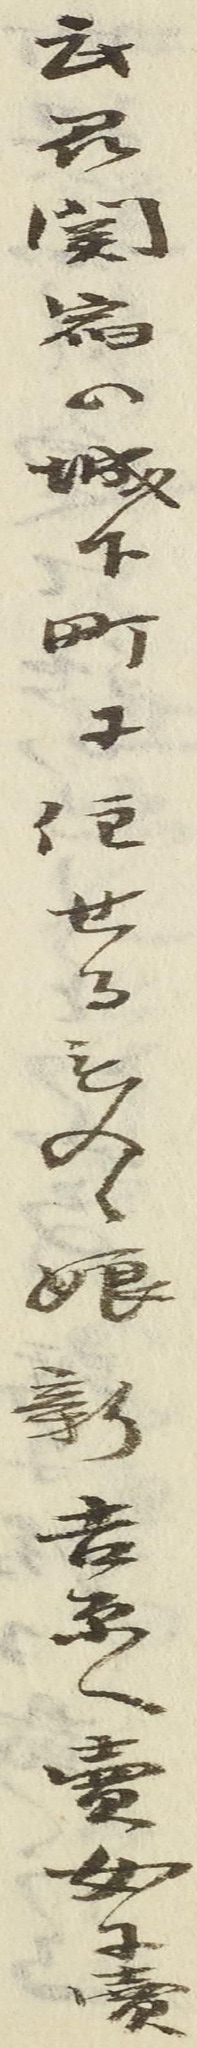此節関宿の城下町に住せるもゝの娘新吉原へ売女に売
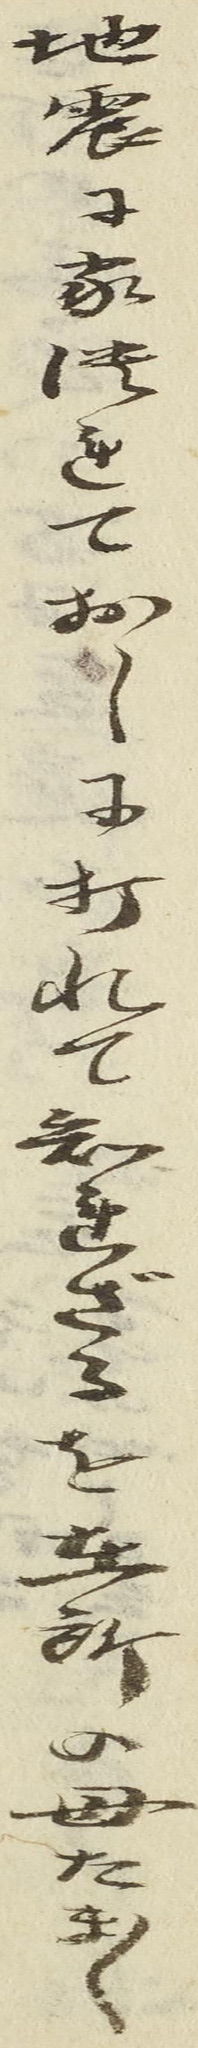地震に家潰れておしに打れて知れざれを在所の母たま〳〵
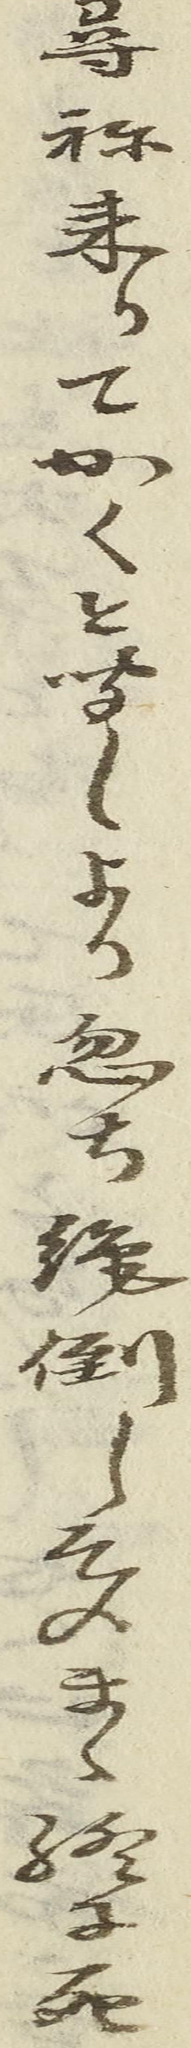尋ね来りてかくと聞しより忽ち絶倒しそのまゝ終に死
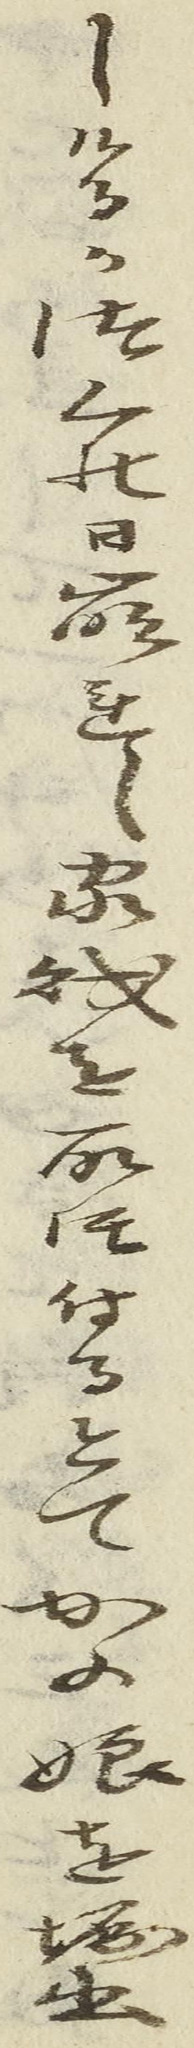しけるかつくの日崩れし家財を取片付けるとてかの娘を堀出
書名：那為の後見艸　全
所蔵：東京大学地震研究所図書室 Earthquake Research Institute Library, The University of Tokyo, JAPAN
